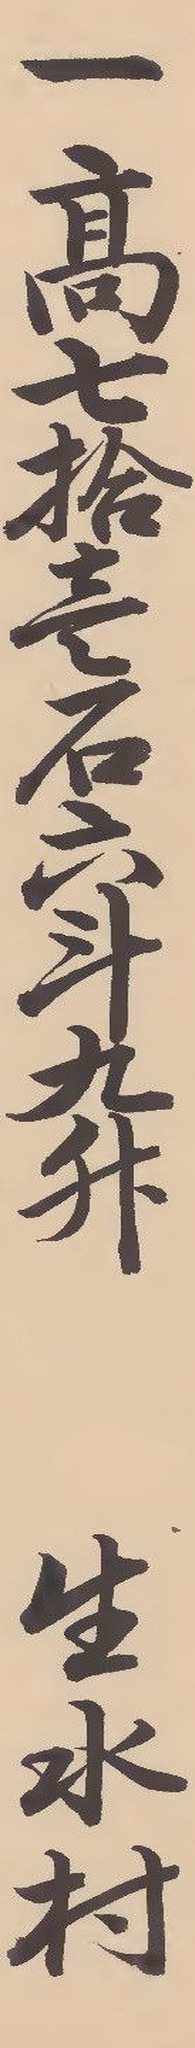一高七拾壱石六斗九升生水村
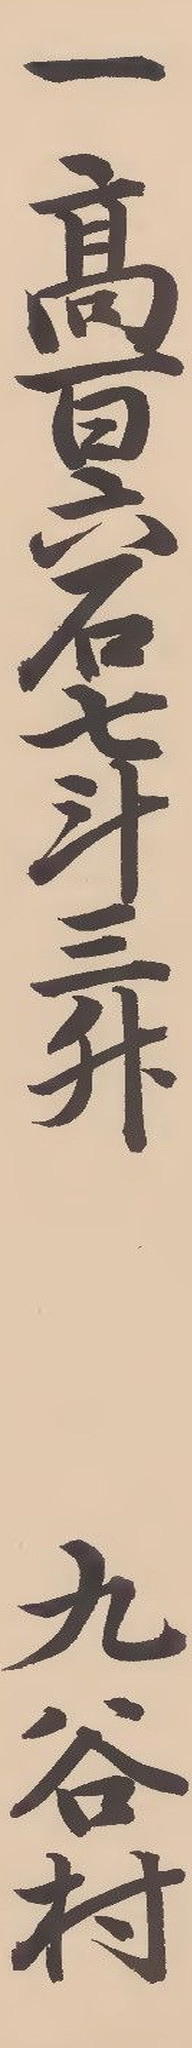一高百六石七斗三升九谷村
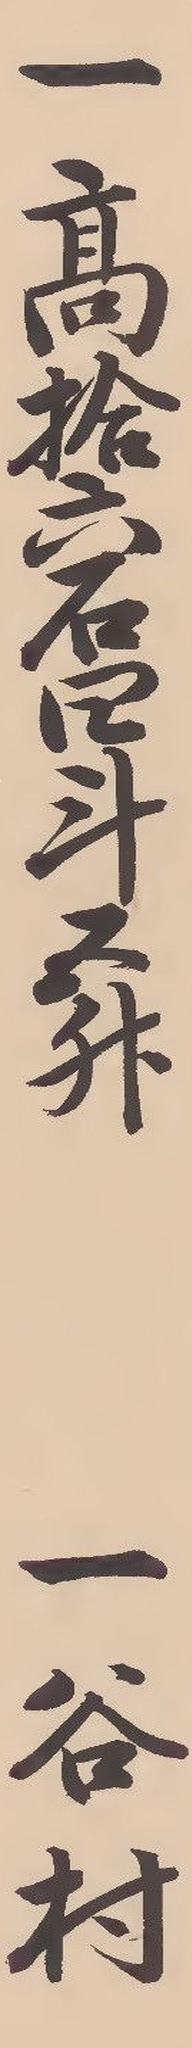一高拾六石四斗五升一谷村
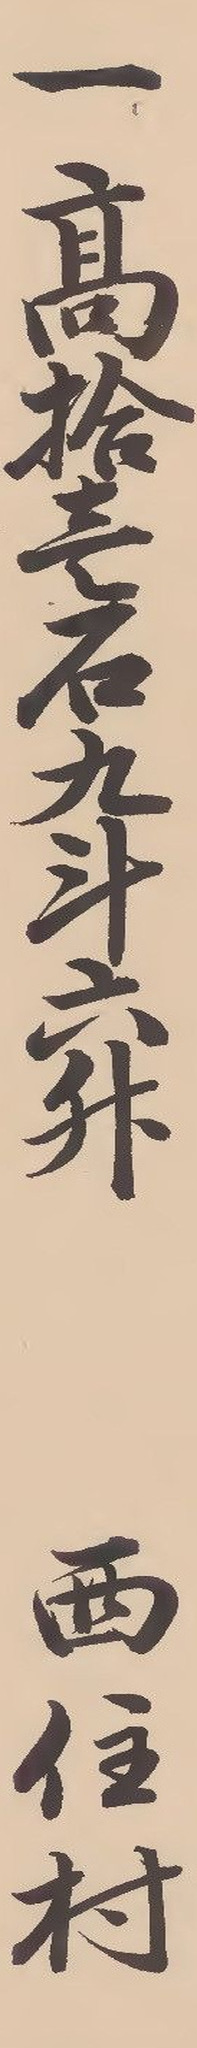一高拾壱石九斗六升西住村
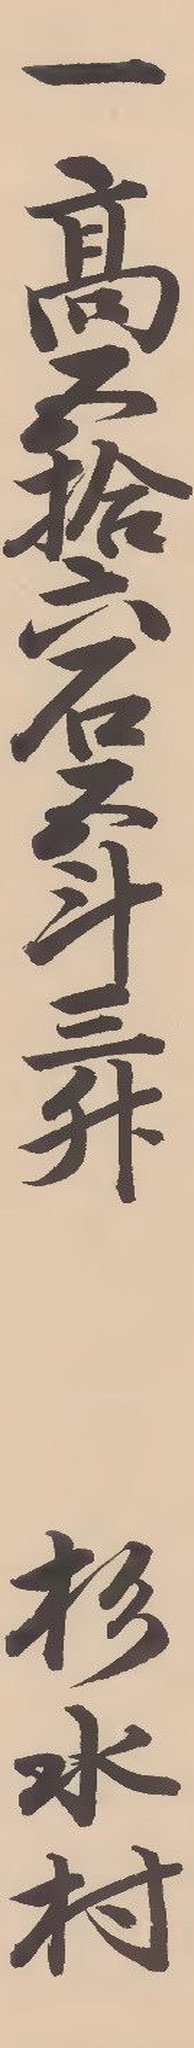一高五拾六石五斗三升杉水村
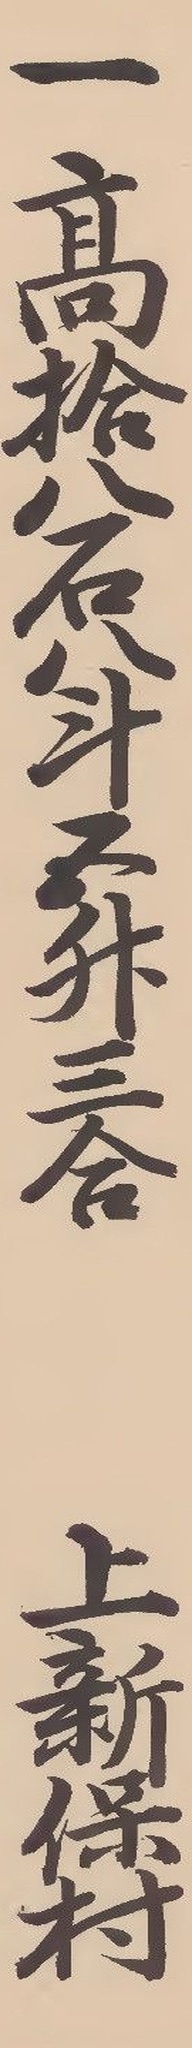一高拾八石八斗五升三合上新保村
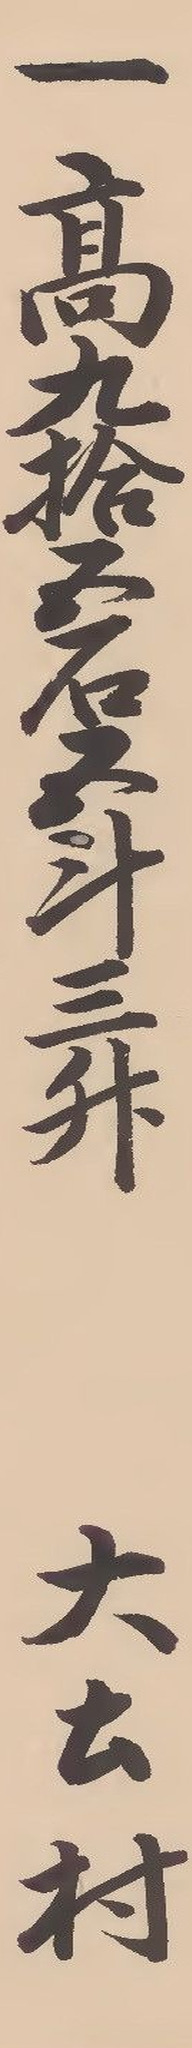一高九拾五石五斗三升大土村

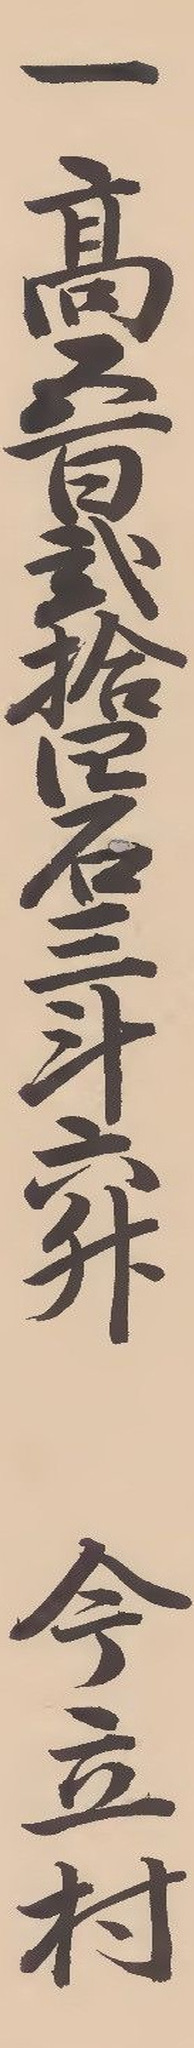一高五百弐拾四石三斗六升今立村
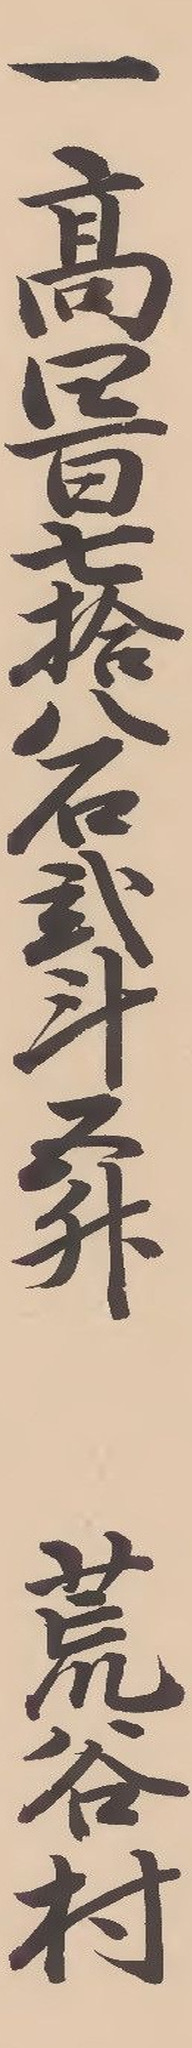一高四百七拾八石弐斗五升荒谷村
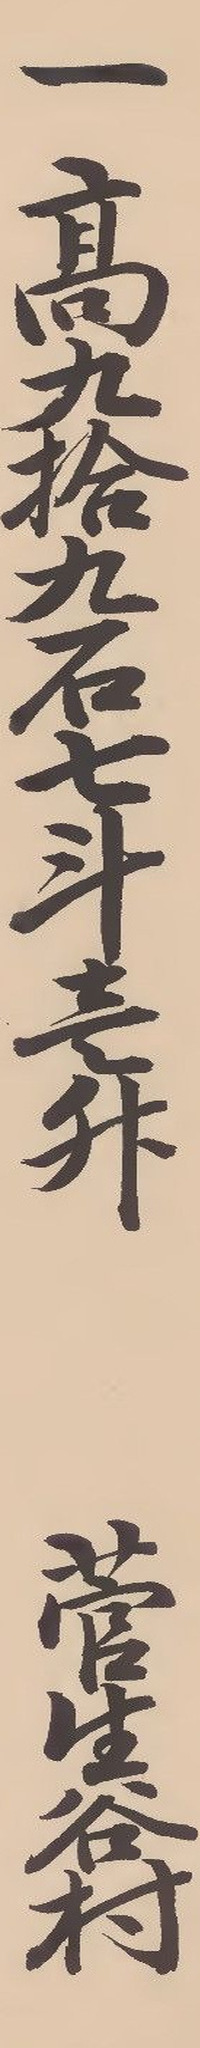一高九拾九石七斗壱升菅生谷村
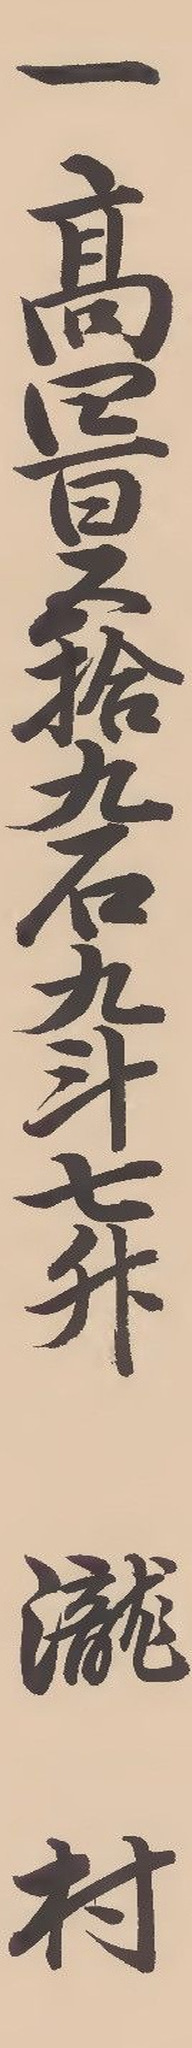一高四百五拾九石九斗七升滝村
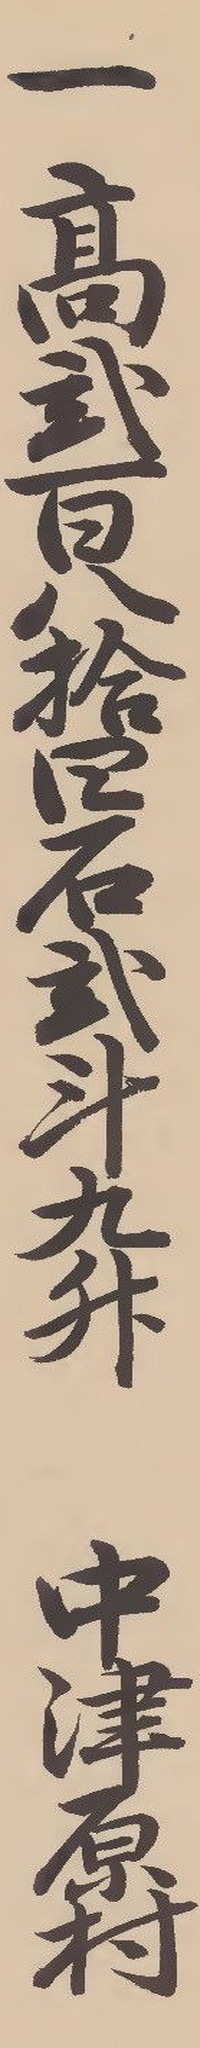一高弐百八拾四石弐斗九升中津原村
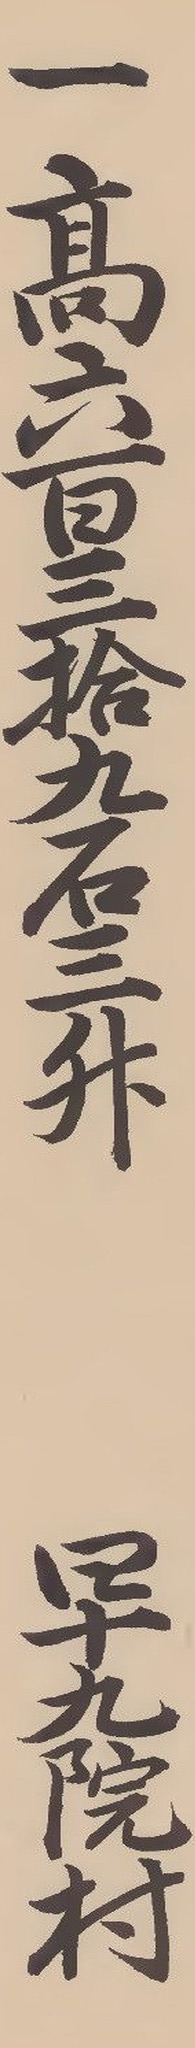一高六百三拾九石三升四十九院村
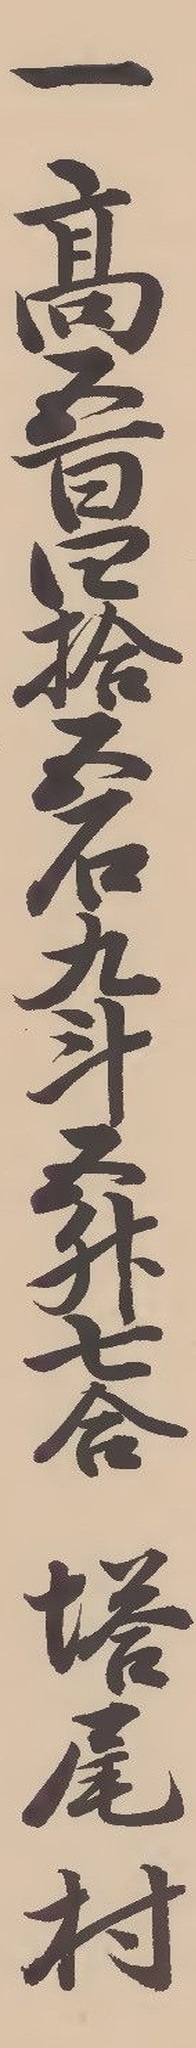一高五百四拾五石九斗五升七合塔尾村
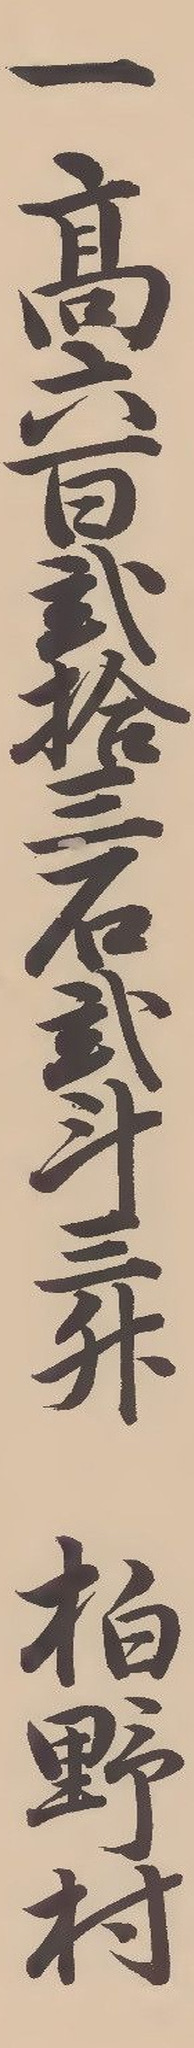一高六百弐拾三石弐斗三升柏野村

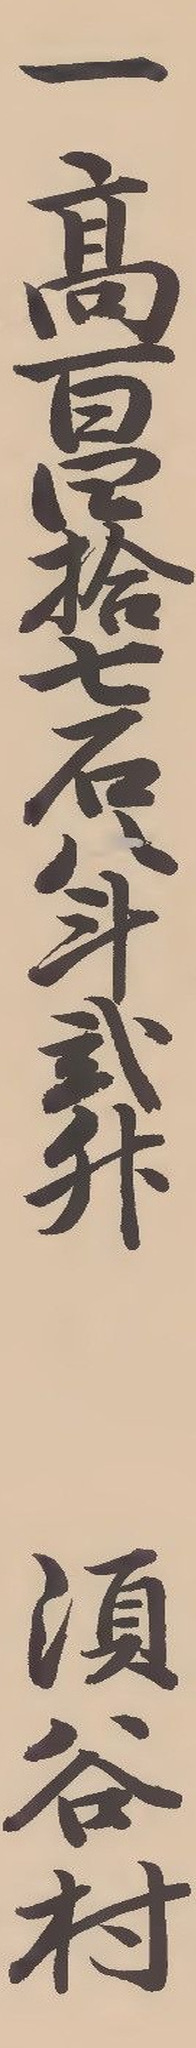一高百四拾七石八斗弐升須谷村
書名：加賀国郷帳
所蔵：国立公文書館 National Archives of Japan
